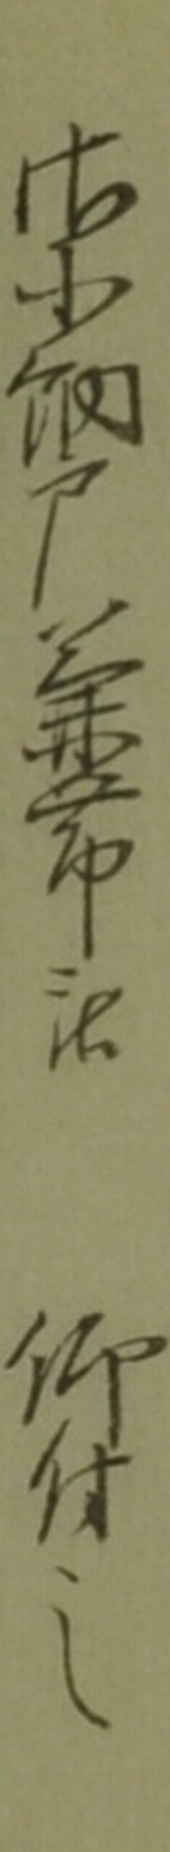御小納戸兼帯被仰付之
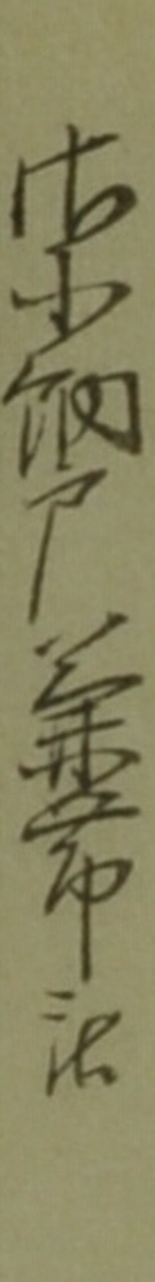目付御小納戸兼帯被
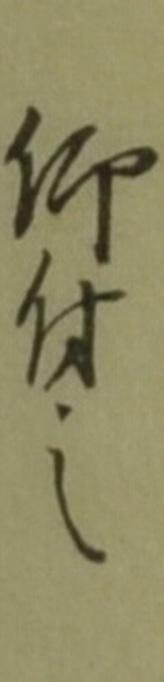仰付之
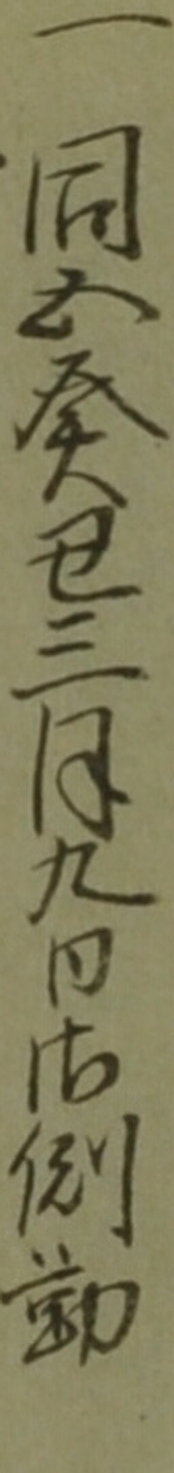一同五癸丑三月九日御側勤
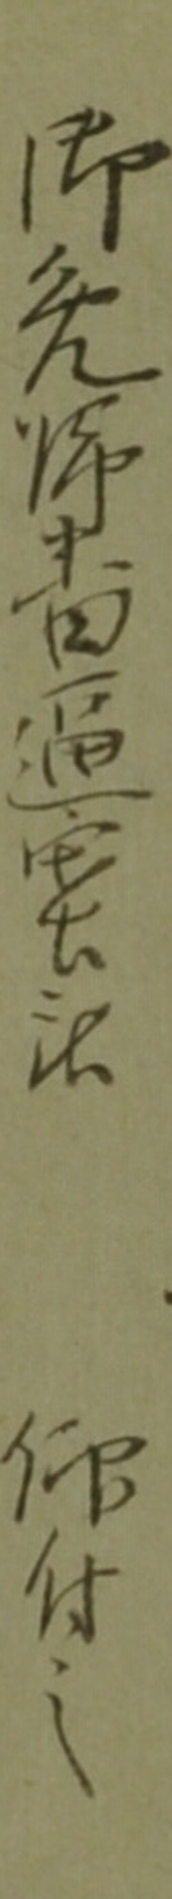御免帰番逼塞被仰付之
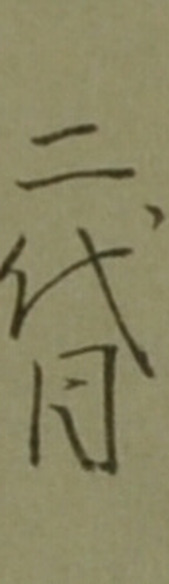二代目
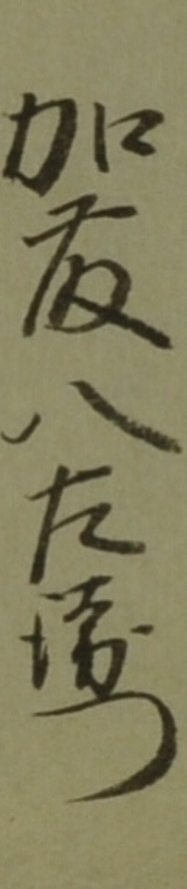加藤八左衛門
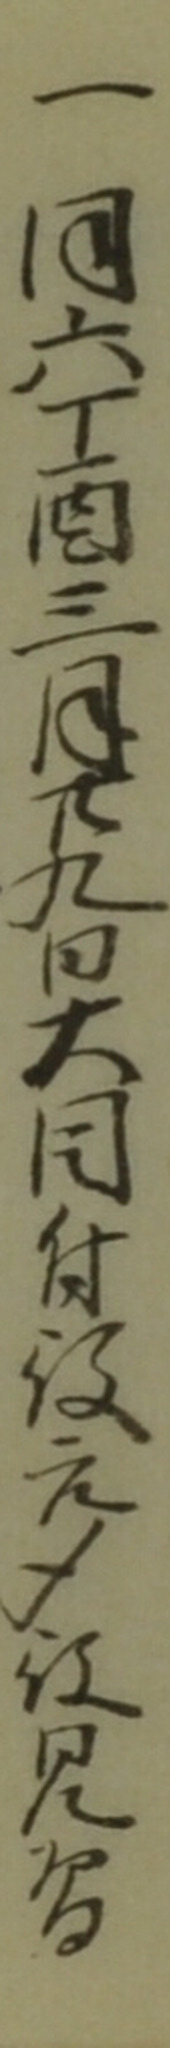一同六丁酉三月廿九日大目付役元〆役見習
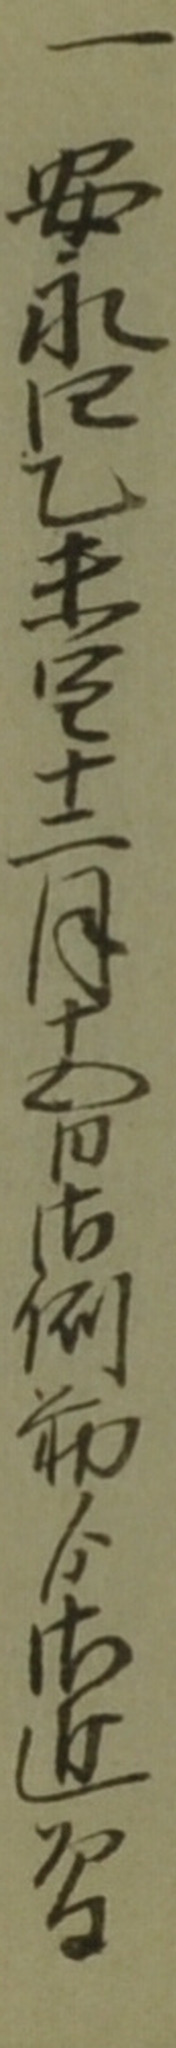一安永四乙未閏十二月十五日御側勤ゟ御近習
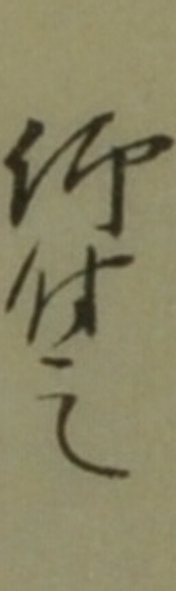仰付之
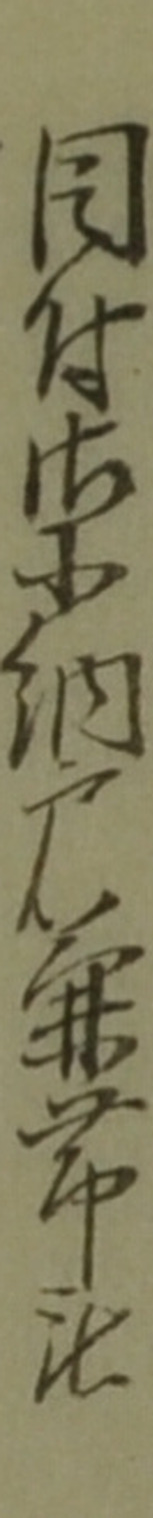目付御小納戸兼帯被
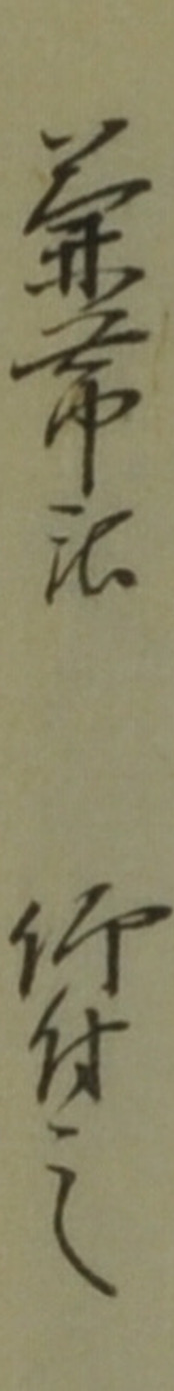兼帯被仰付之
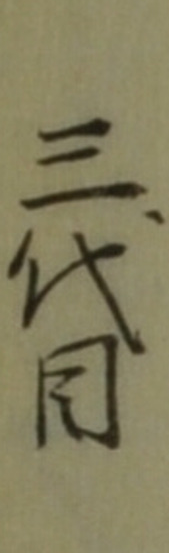三代目
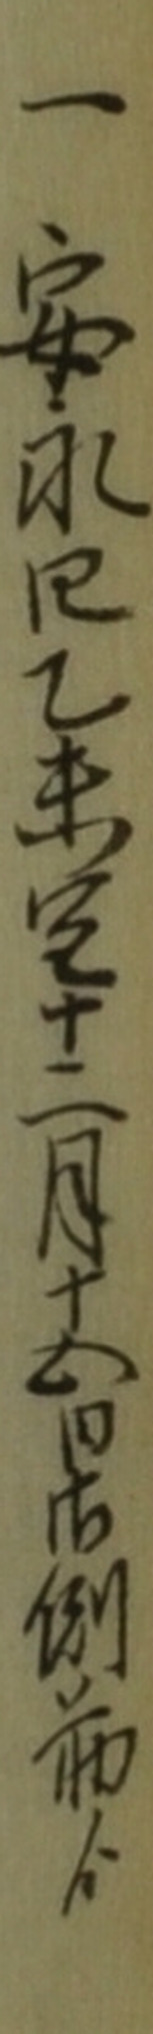一安永四乙未閏十二月十五日御側前ゟ
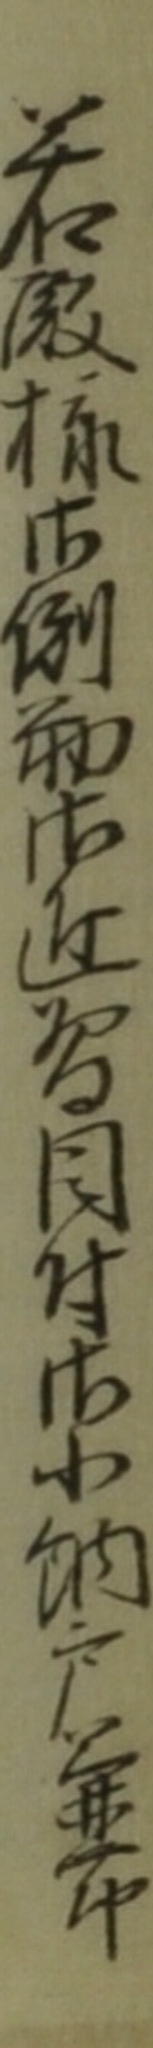若殿様御側勤御近習目付御小納戸兼帯
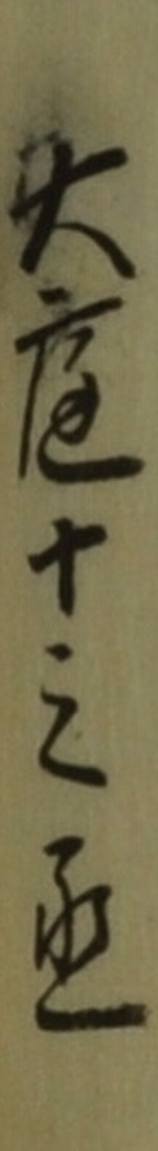大庭十之丞
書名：諸御役代々録（四）
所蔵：伊那市立高遠町図書館・合同会社AMANE
